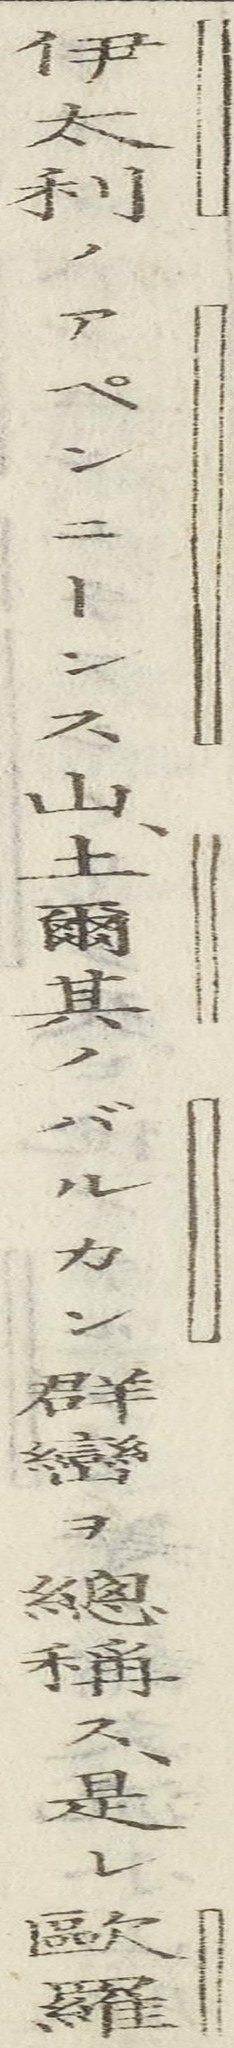伊太利ノアペンニーンス山、土爾其ノバルカン群巒ヲ総称ス、是レ欧羅
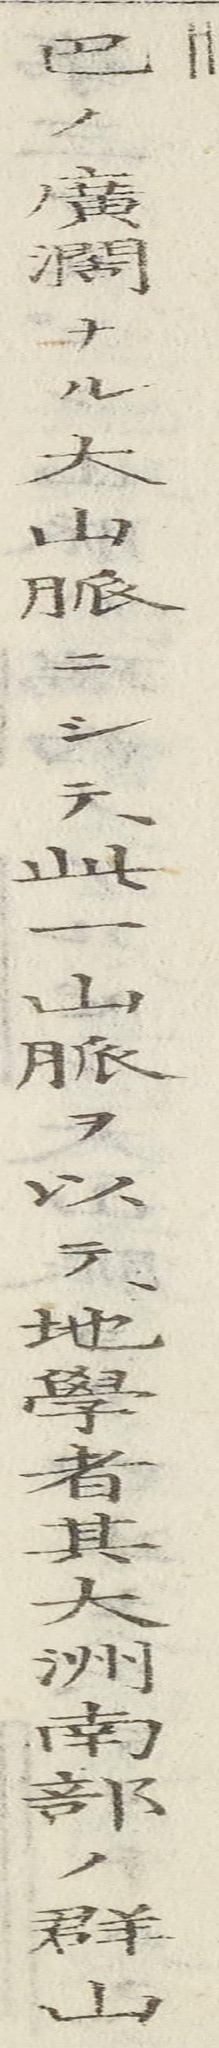巴ノ広濶ナル大山脈ニシテ、此一山脈ヲ以テ、地学者其大洲南部ノ群山
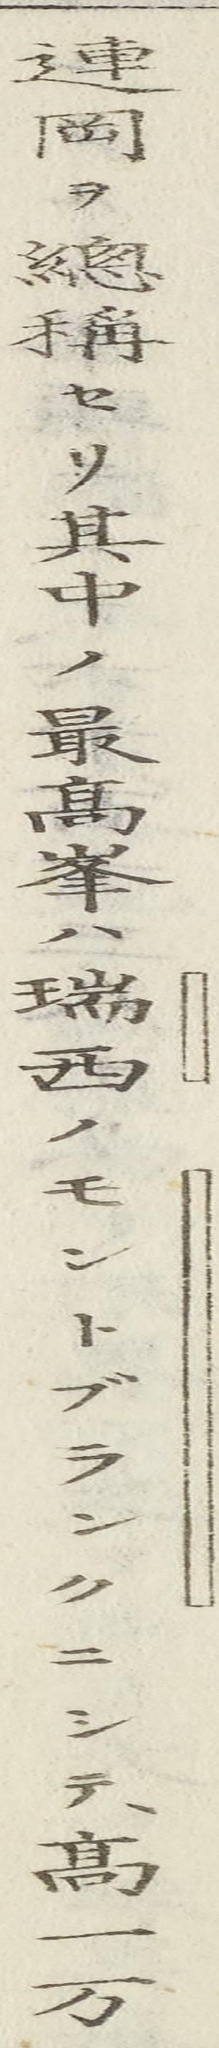連岡ヲ総称セリ其中ノ最高峯ハ瑞西ノモントブランクニシテ、高一万
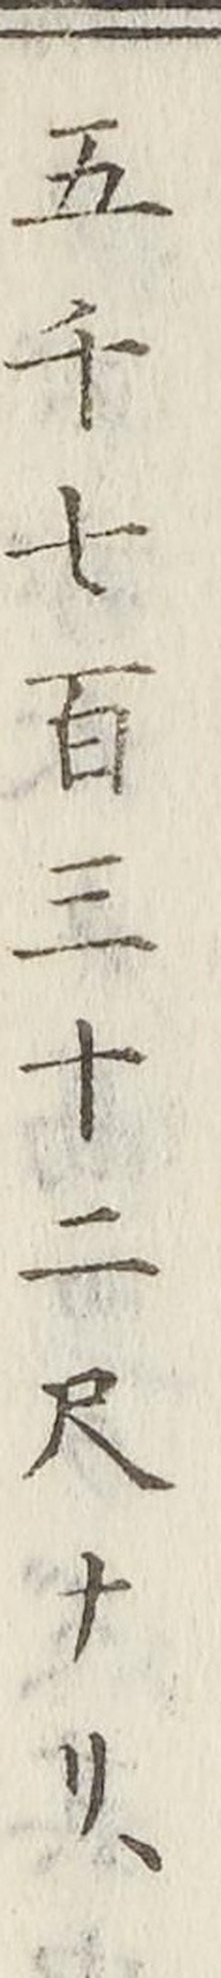五千七百三十二尺ナリ、
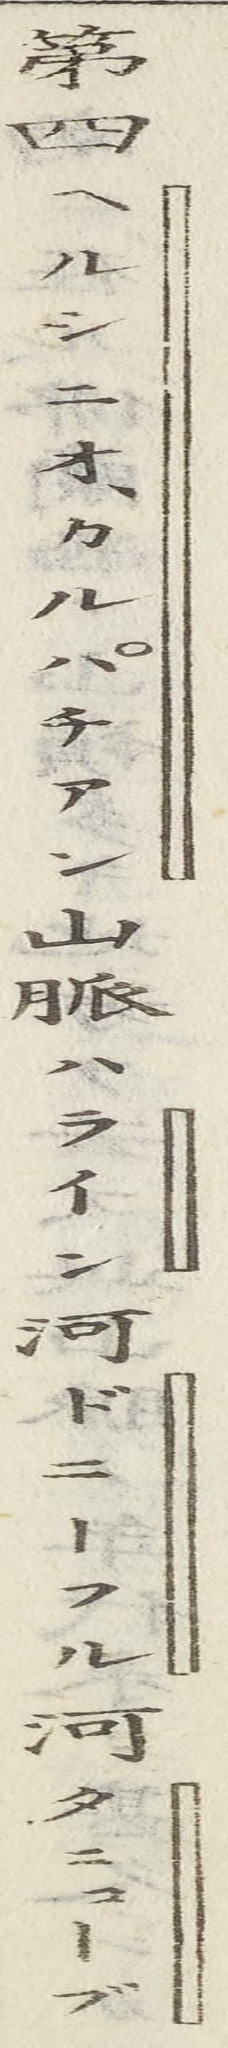第四ヘルシニオ、カルパチアン山脈ハライン河ドニーフル河タニューブ
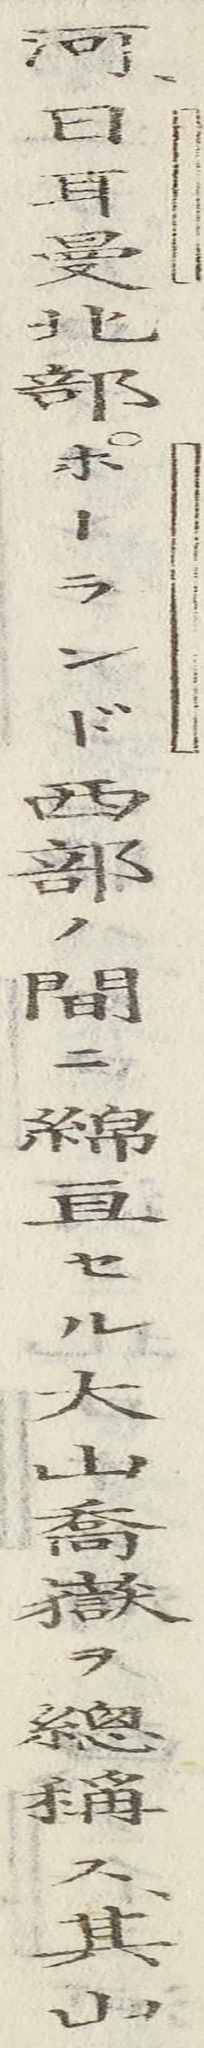河、日耳曼北部ポーランド西部ノ間ニ綿亘セル大山喬嶽ヲ総称ス、其山
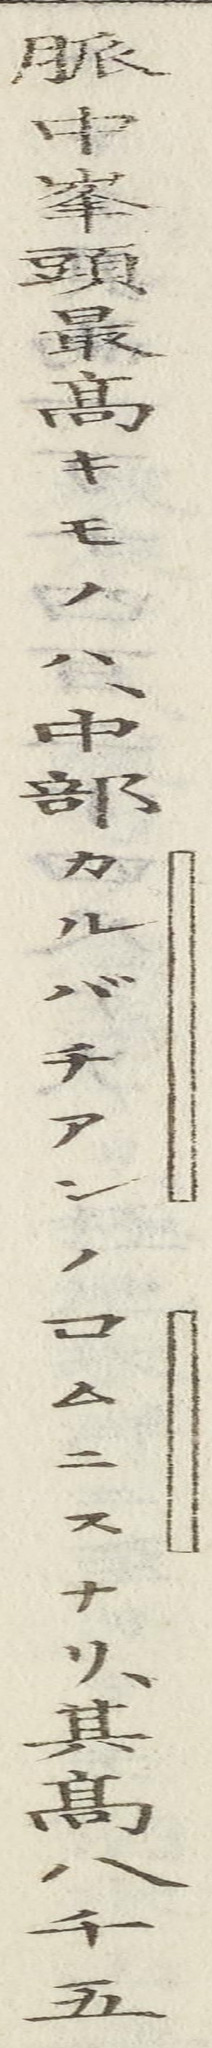脈中峯頭最高キモノハ、中部カルバチアンノロムニスナリ、其高八千五
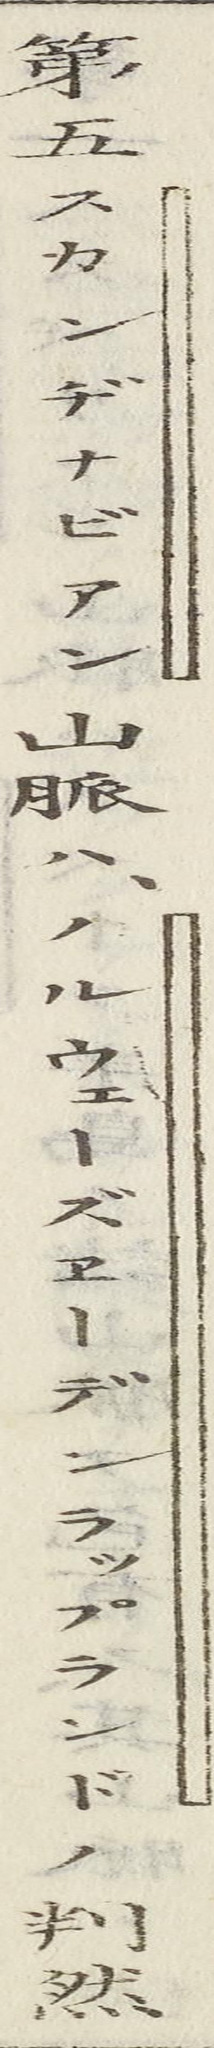第五スカンヂナビアン山脈ハ、ノルウェーズエーデンラップランドノ判然
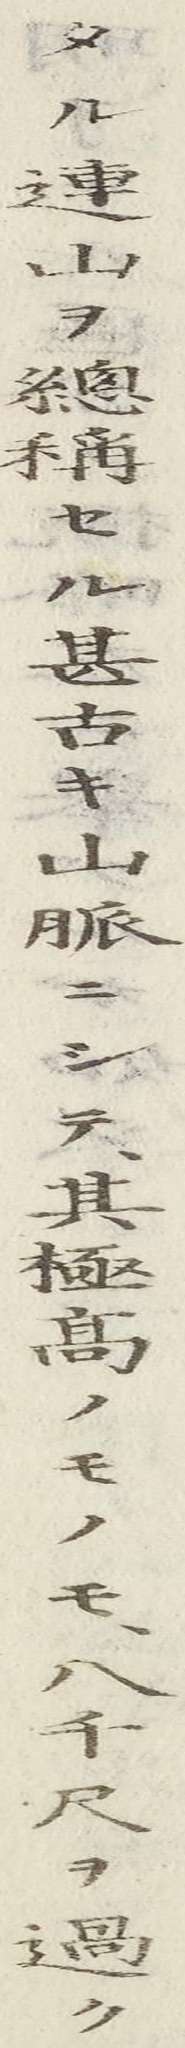タル連山ヲ総称セル甚古キ山脈ニシテ、其極高ノモノモ、八千尺ヲ過ク
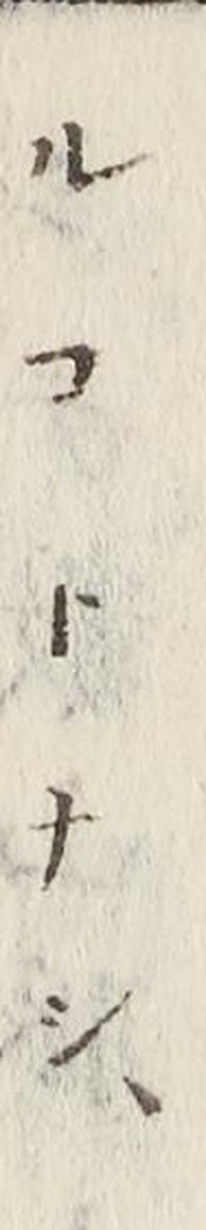ルコトナシ、
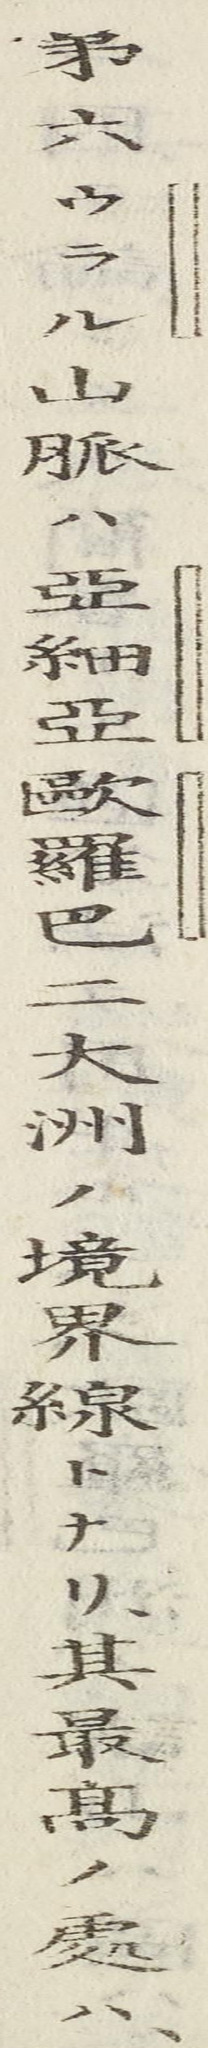第六ウラル山脈ハ亜細亜欧羅巴ニ大洲ノ境界線トナリ、其最高ノ処ハ、
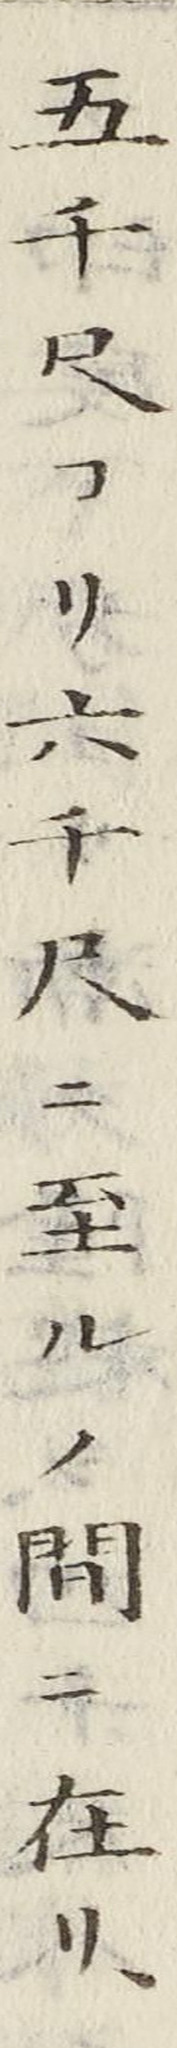五千尺ヨリ六千尺ニ至ルノ間ニ在リ、
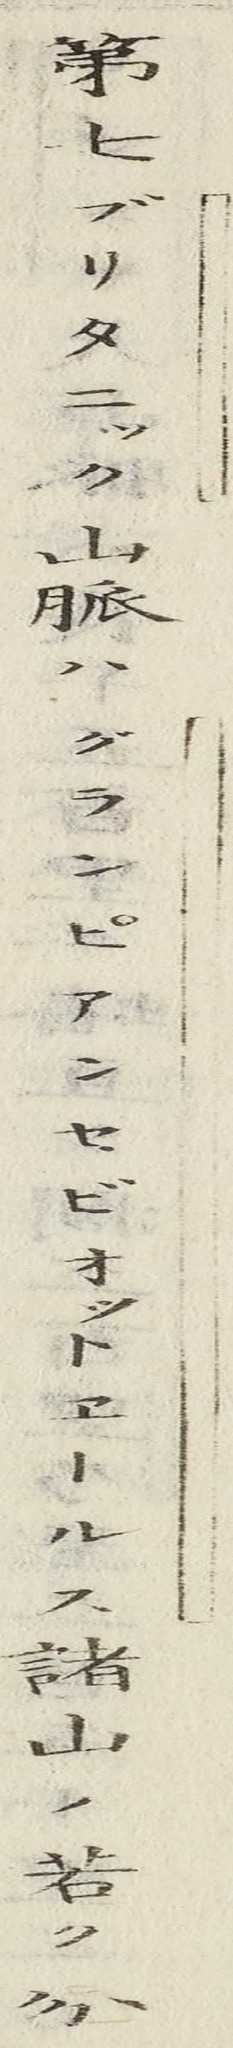第七ブリタニック山脈ハグランピアンセビオットエールス諸山ノ若ク分
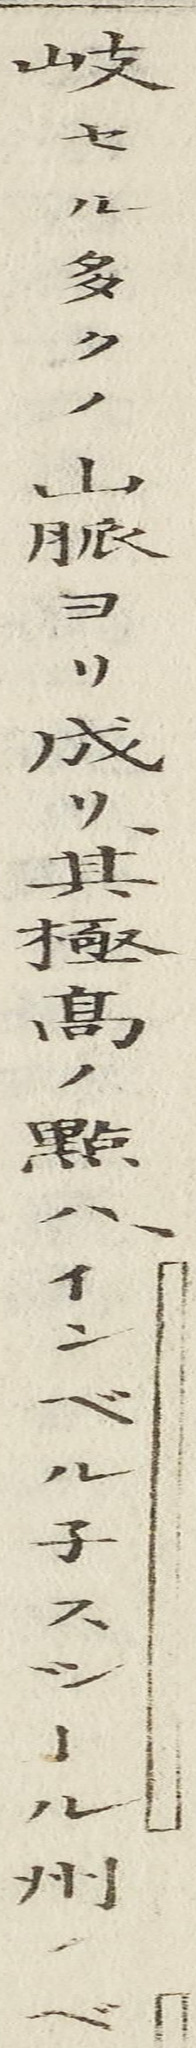岐セエル多クノ山脈ヨリ成リ、其極高ノ点ハ、インベルネスシール州ノベ
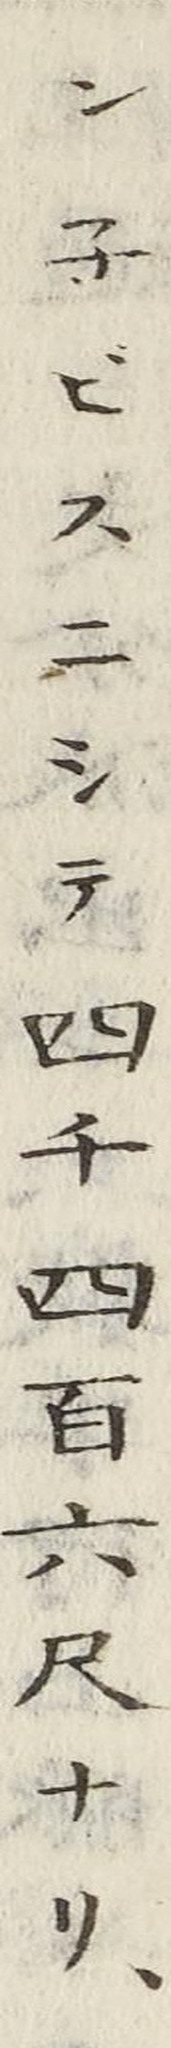ンネビスニシテ四千四百六尺ナリ、
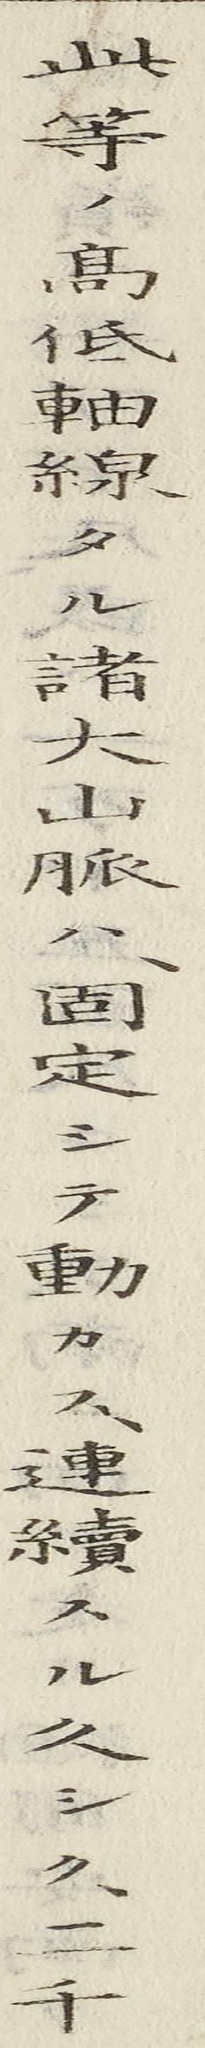此等ノ高低軸線タル諸大山脈ハ、固定シテ動カス、連続スル久シク、二千
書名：百科全書　地文學　全
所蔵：東京大学地震研究所図書室 Earthquake Research Institute Library, The University of Tokyo, JAPAN
